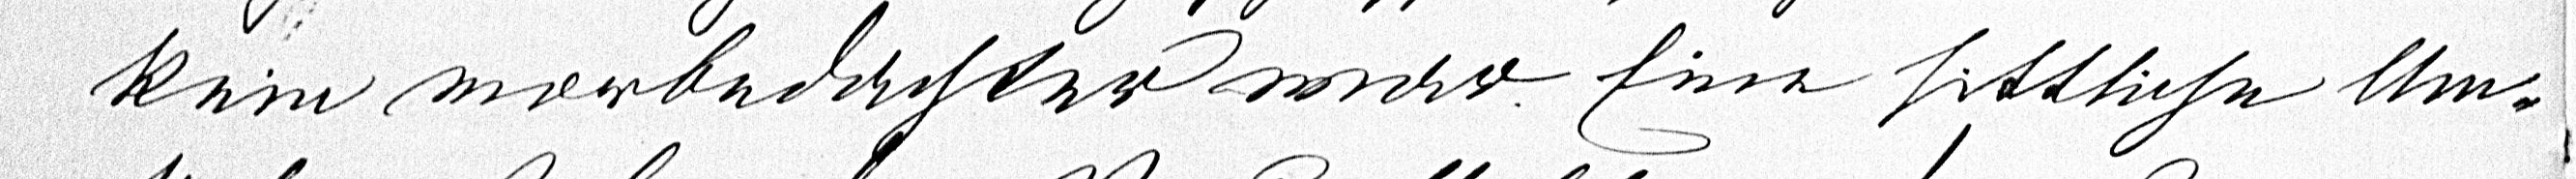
kein vorbedachter war. Eine sittliche Um¬
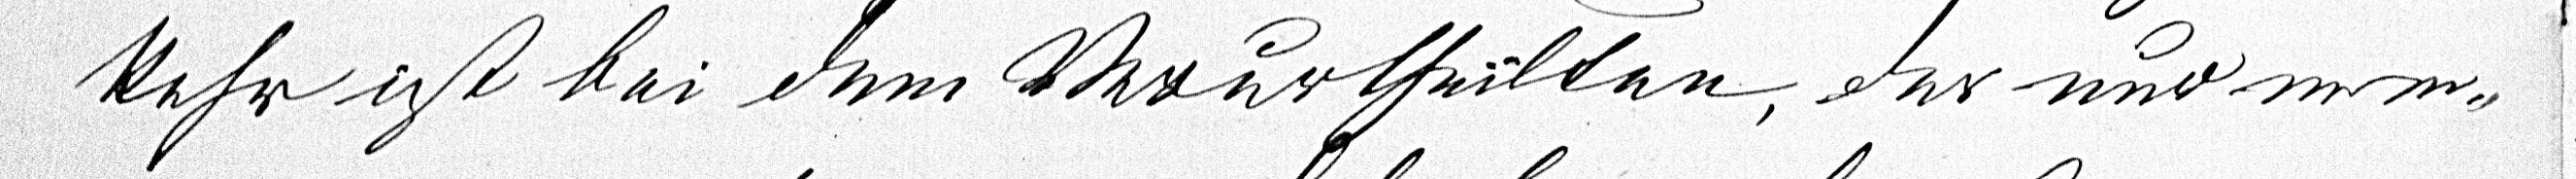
kehr ist bei dem Verurtheilten, der nur we¬
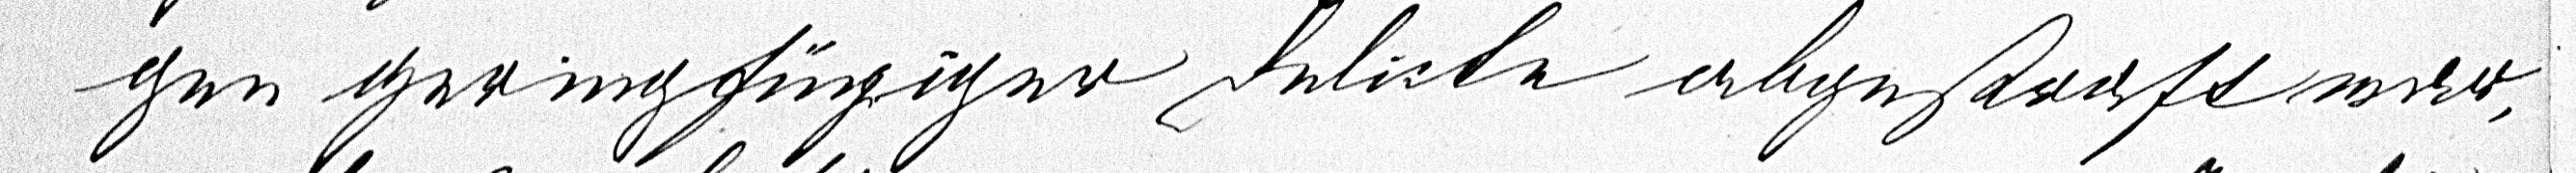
gen geringfügiger Delicte abgestraft war,
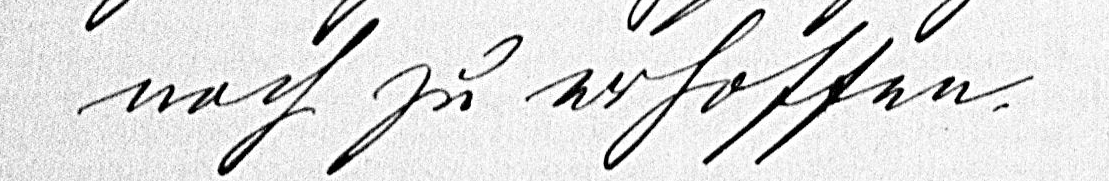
noch zu erhoffen.
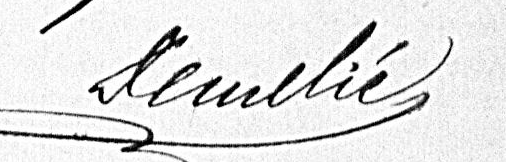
xx
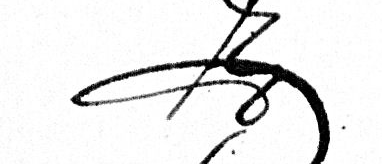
xx
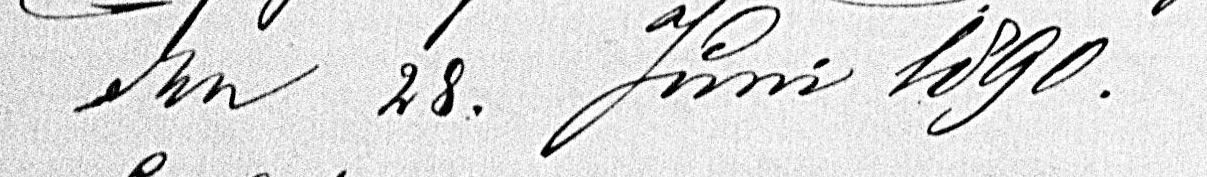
den 28. Juni 1890.
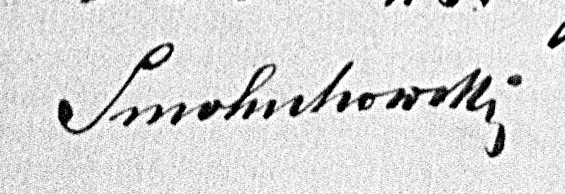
Smolxx
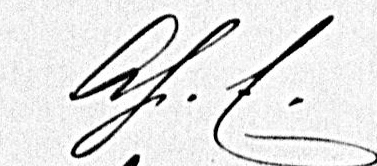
Ah. E.
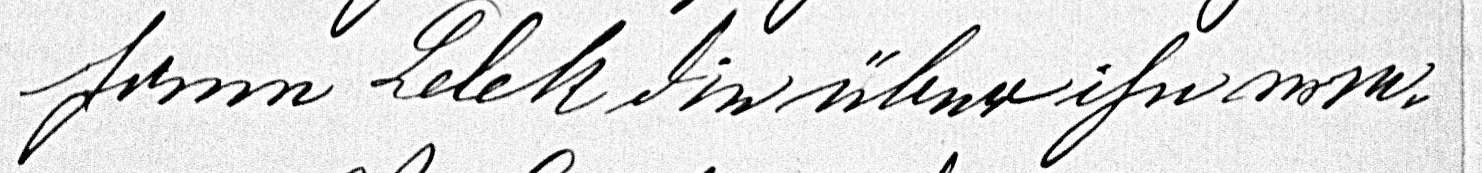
hann Lelek die über ihn we¬
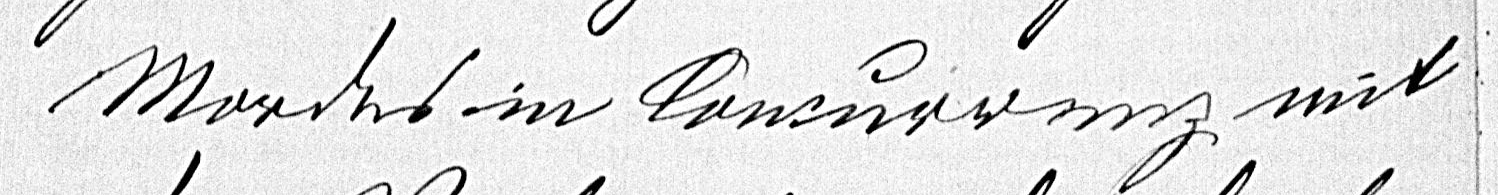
Mordes in Concurrenz mit
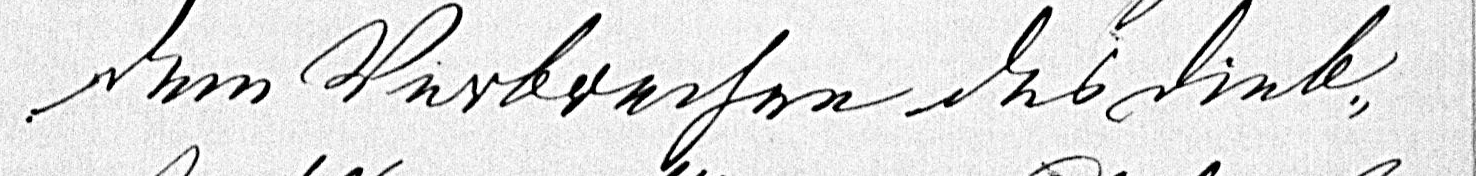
dem Verbrechen des Dieb¬
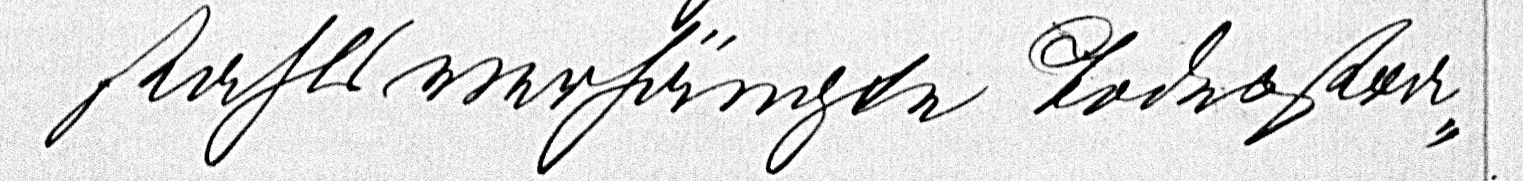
stahls verhängte Todesstra¬
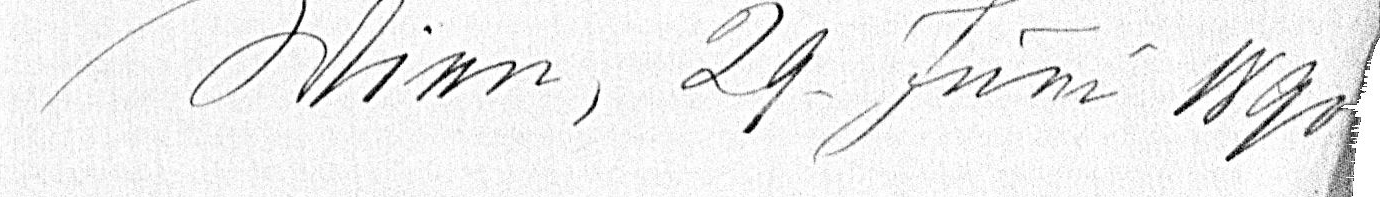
Wien, 29. Juni 1890
